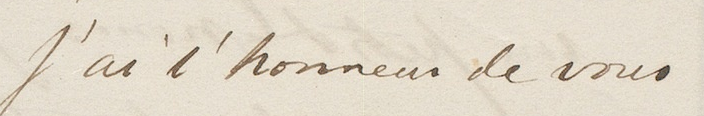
J'ai l'honneur de vous
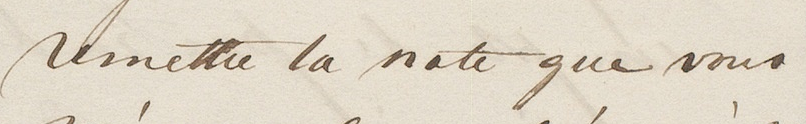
remettre la note que vous
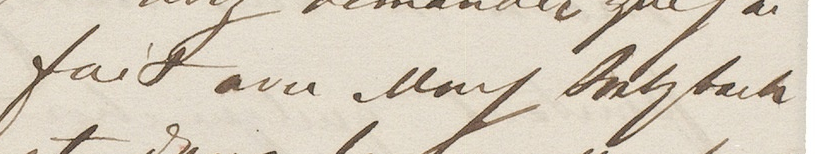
fait avec Mons Sulzbach
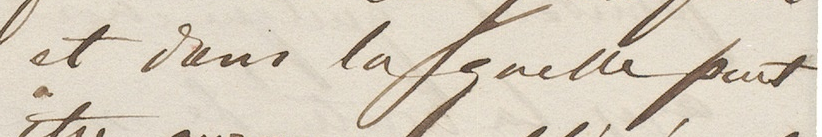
et dans laquelle peut
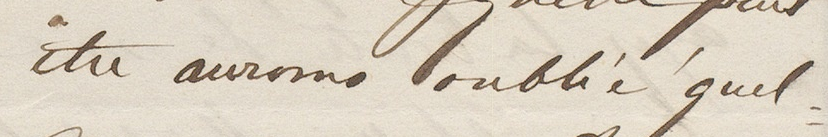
être aurons oublié quel-
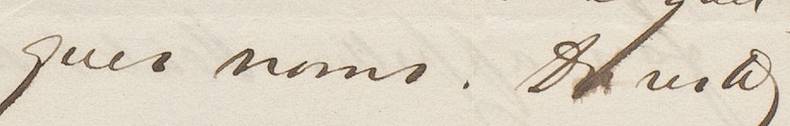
ques noms. De nous
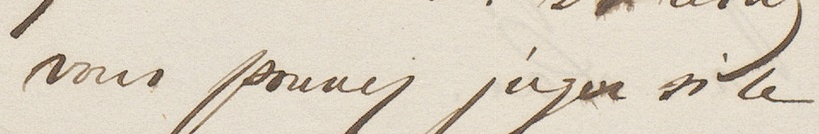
vous pouvez juger si le
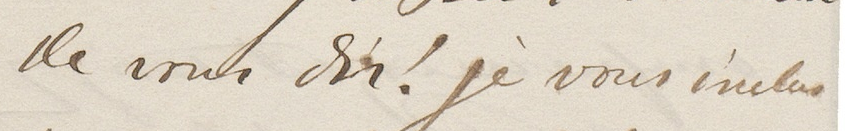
de vous dir! Je vous inclus
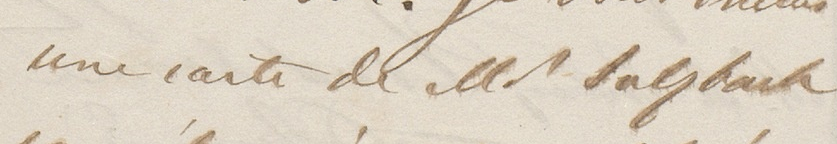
une carte de MrSulzbach
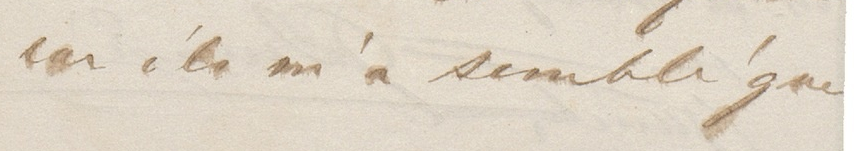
car ils m'a semblé que
